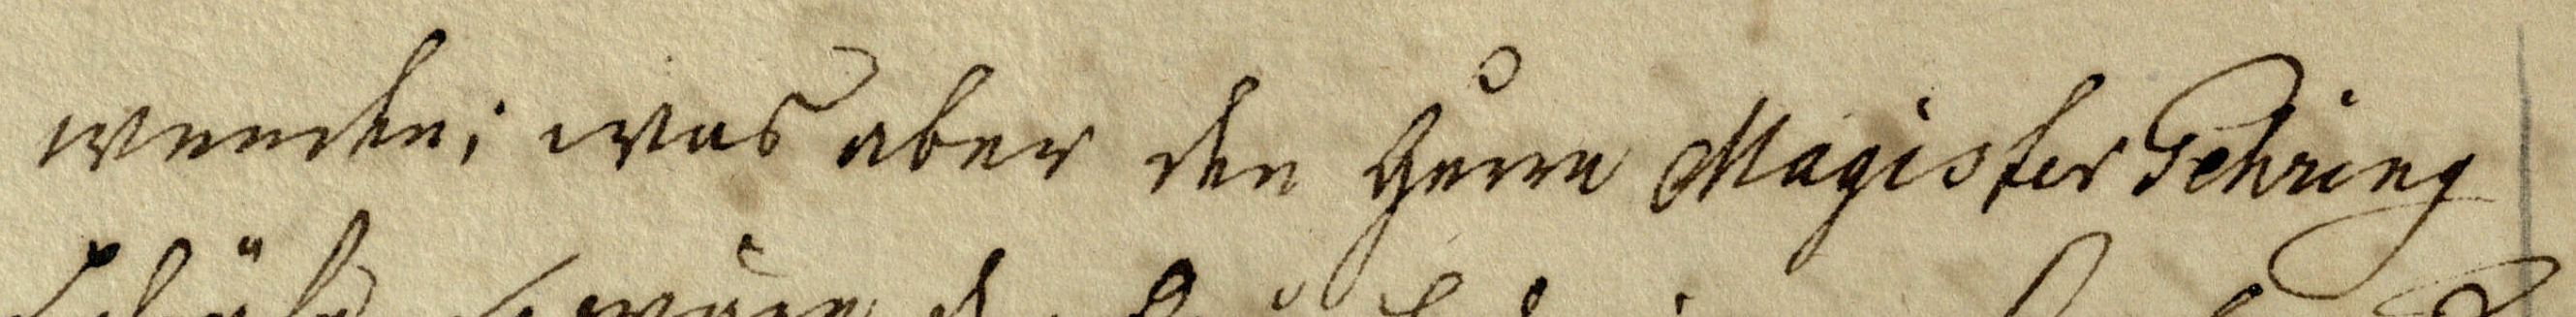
wenden; was aber den Herrn Magister Gehring
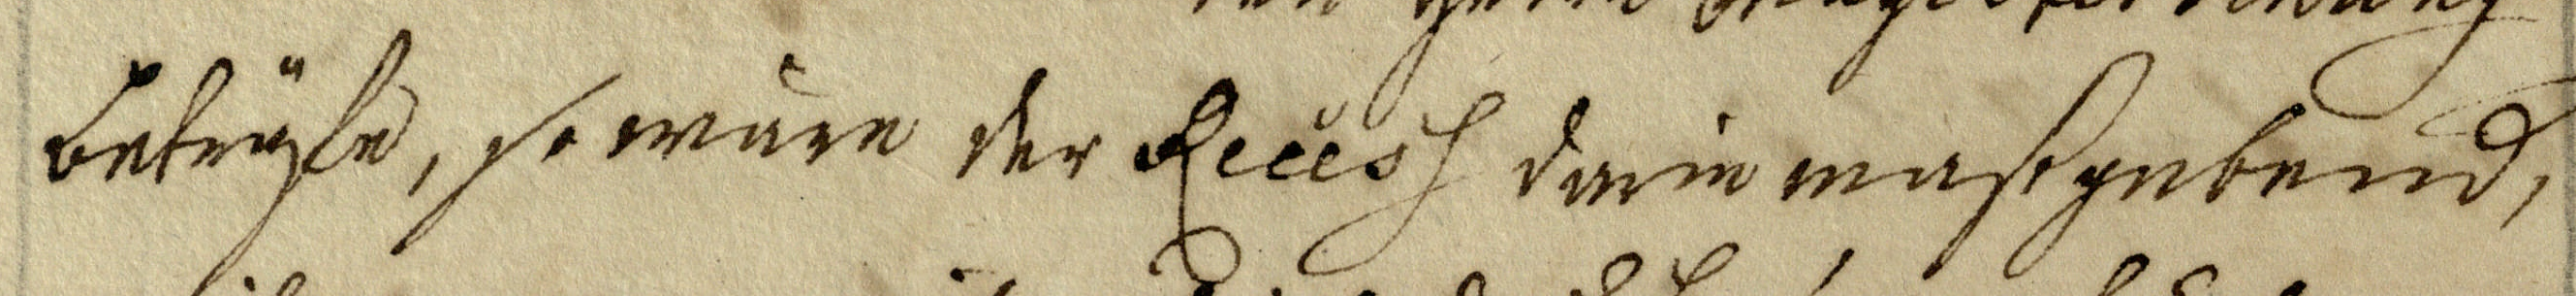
beträfe, so wäre der Recess darin maßgebend,
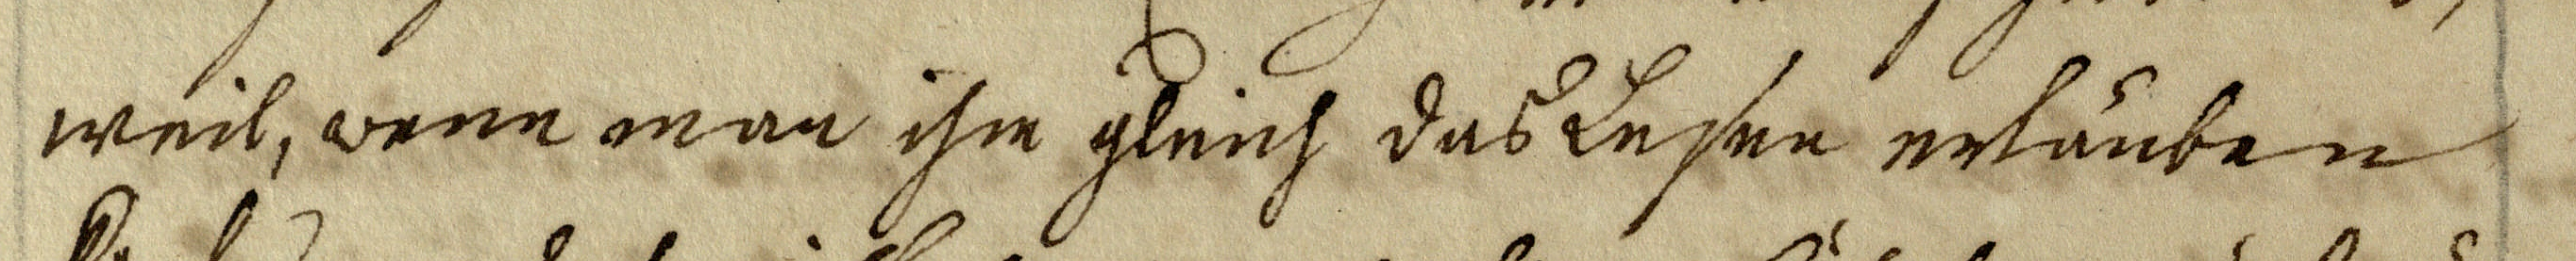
weil, wenn man ihm gleich das Lesen erlauben
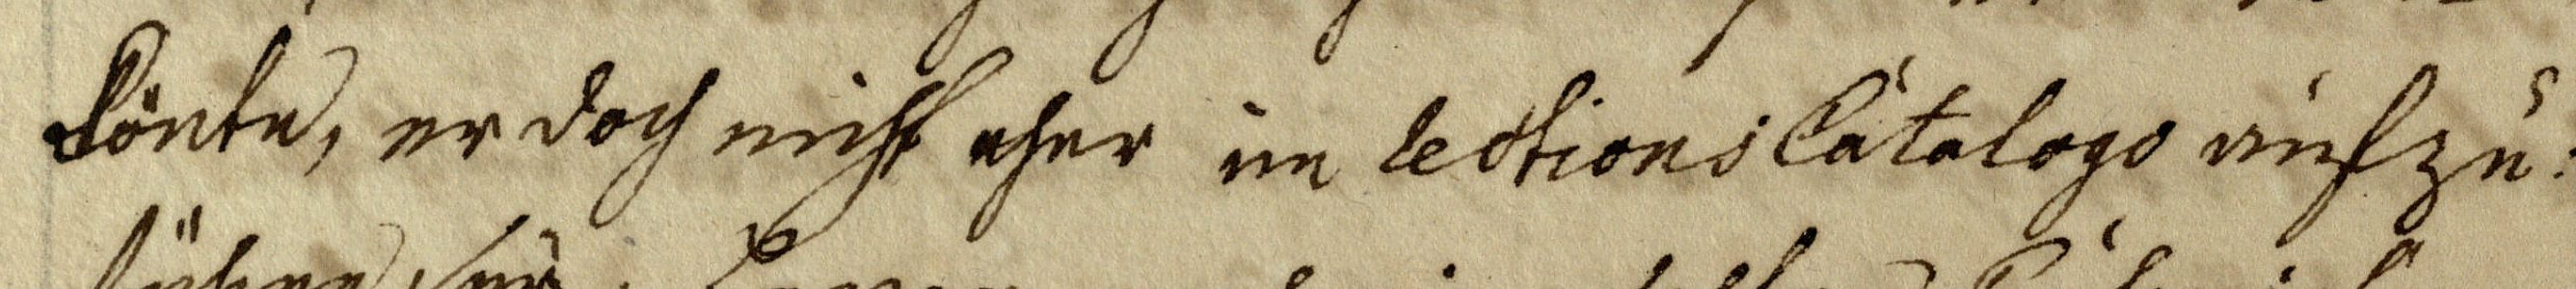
könte, er doch nicht eher in Lections Catalogo aufzu¬
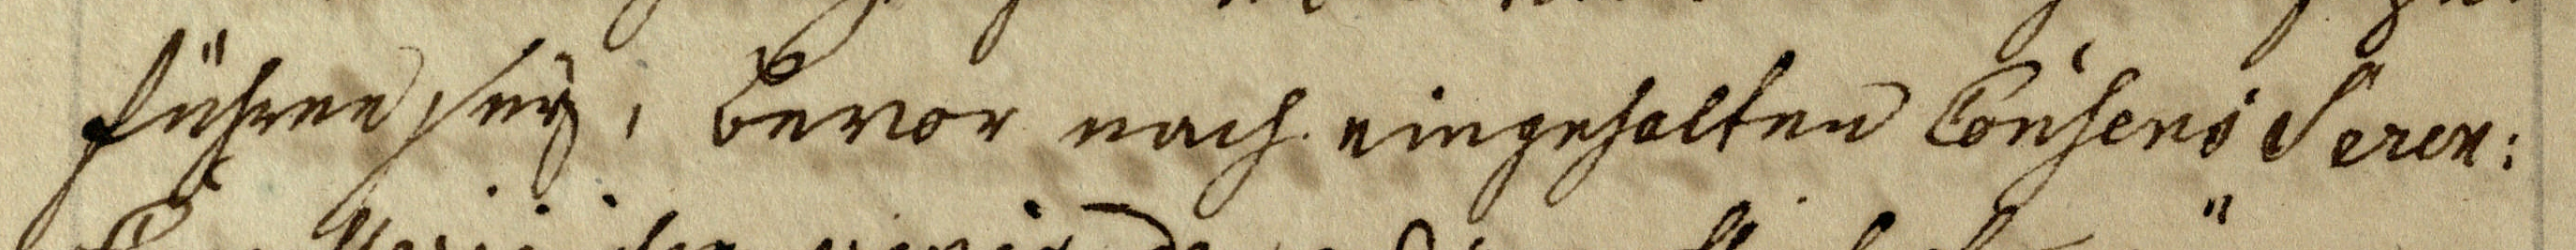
führen seÿ, bevor nach eingehalten Consens Seren.
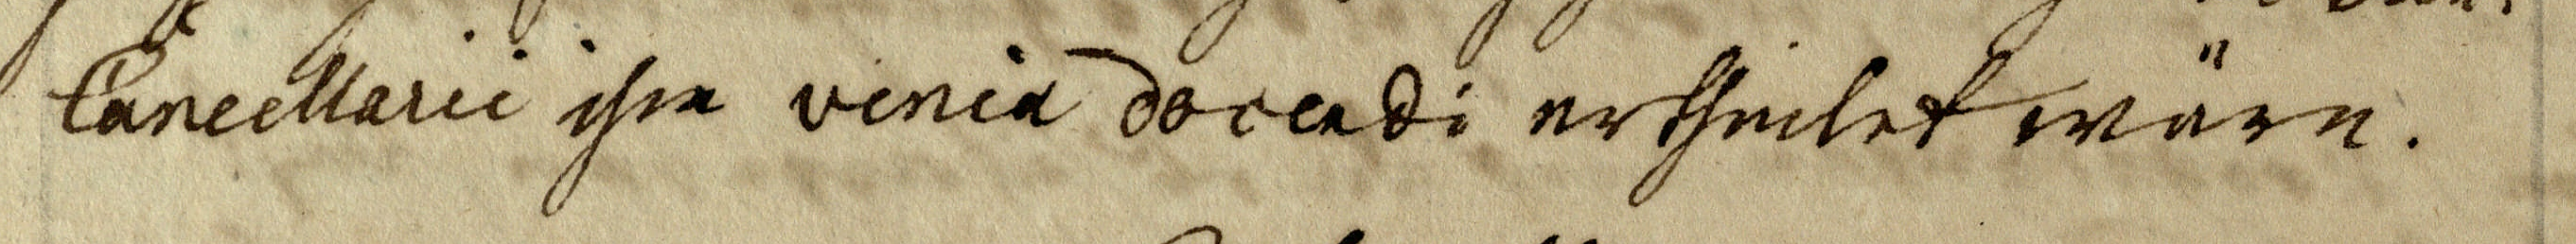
Cancellarii ihm venea docendi ertheilet wäre.
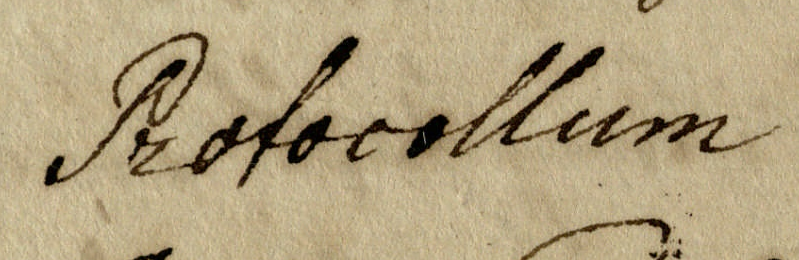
Protocollum
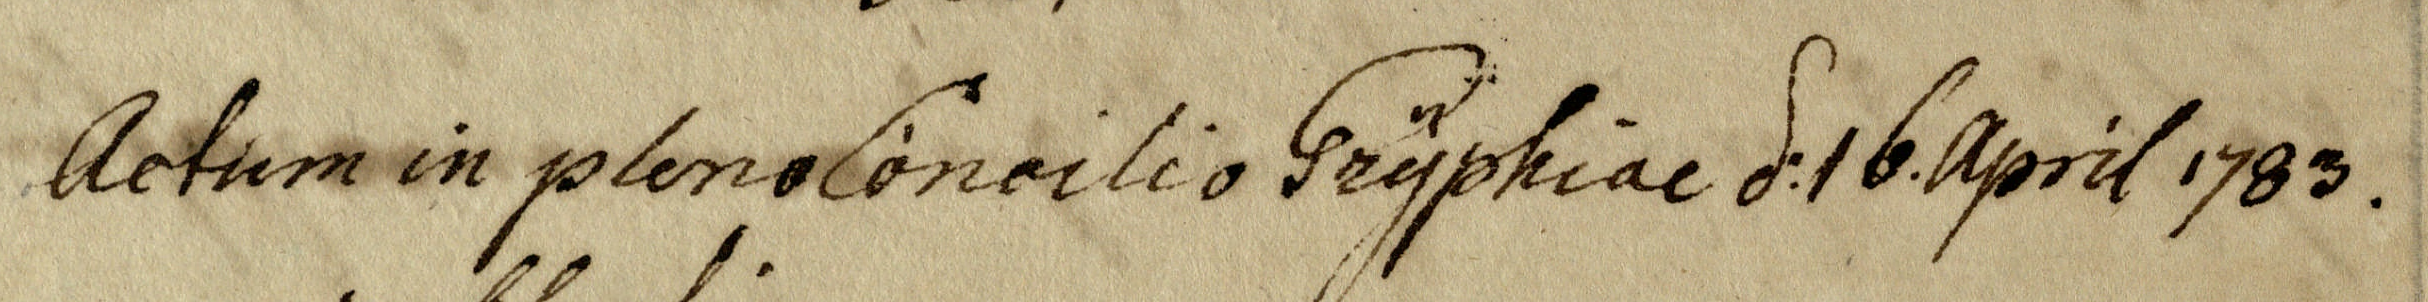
Actum in pleono Concilio Grÿphiae d. 16. April 1783.
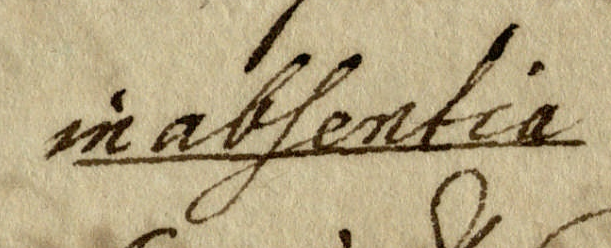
in absentia
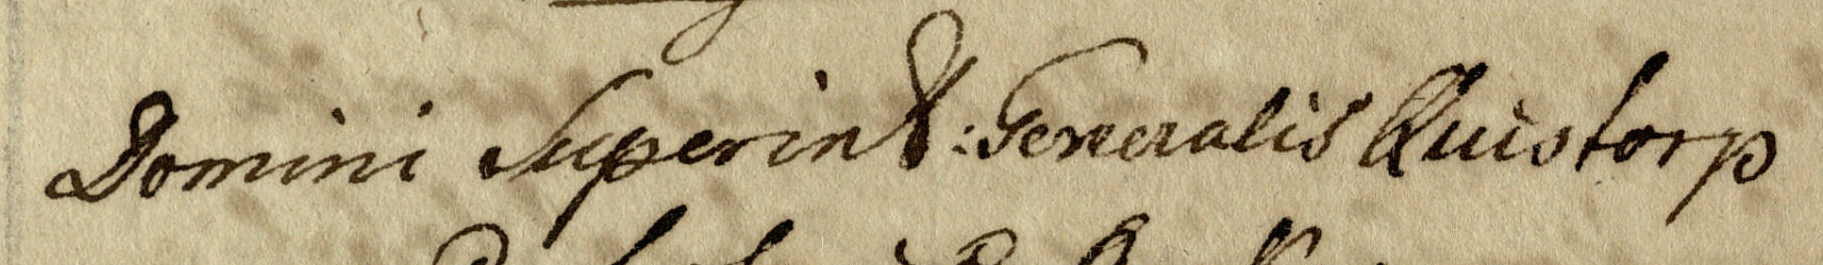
Domini Superint. Generalis Quistorp
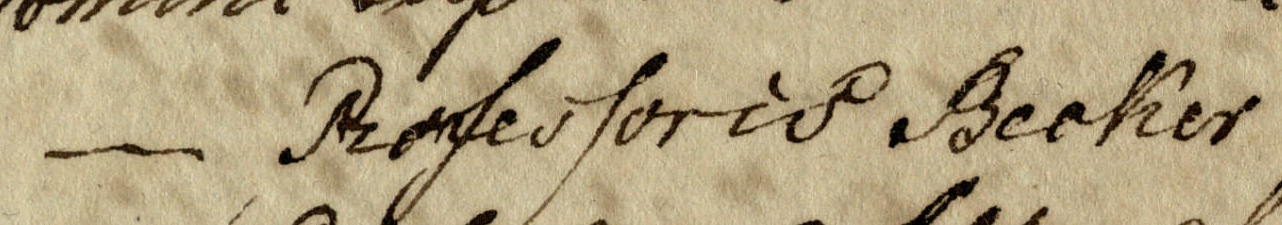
Professoris Becker
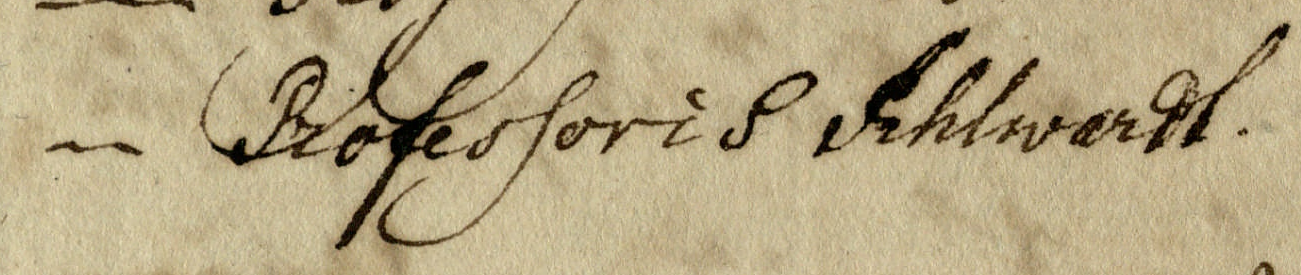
Professoris Ahlwardt.
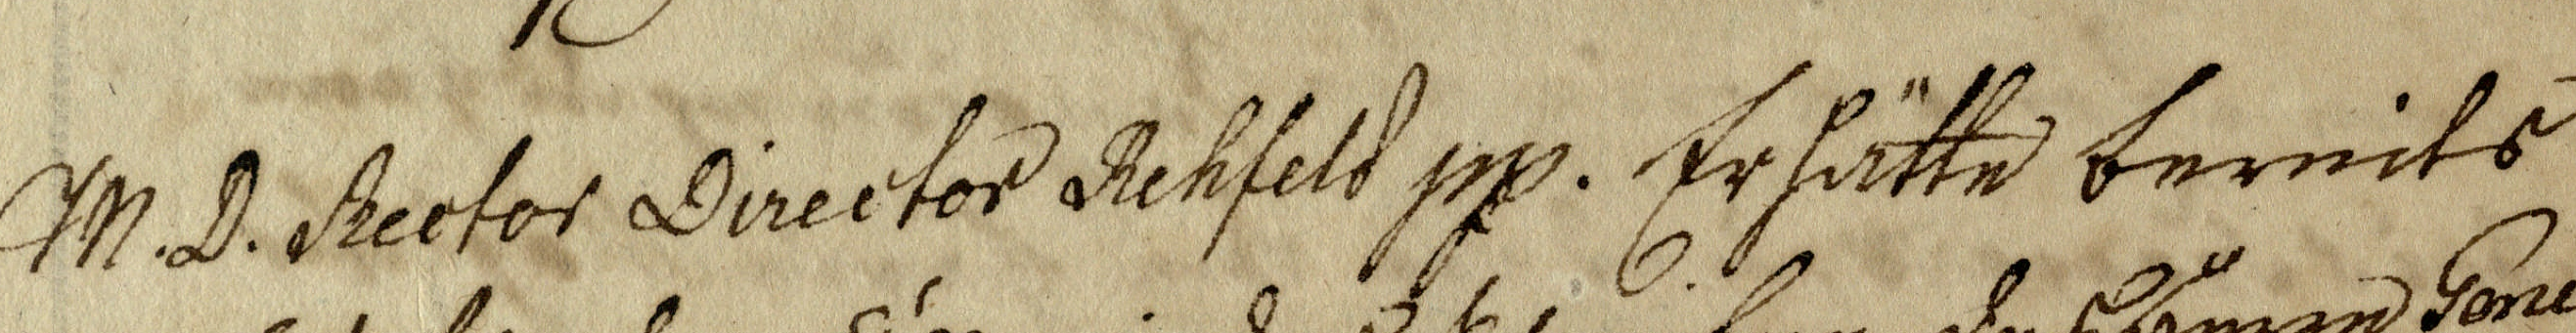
M. D. Rector Director Rehfeld pp. Er hätte bereits
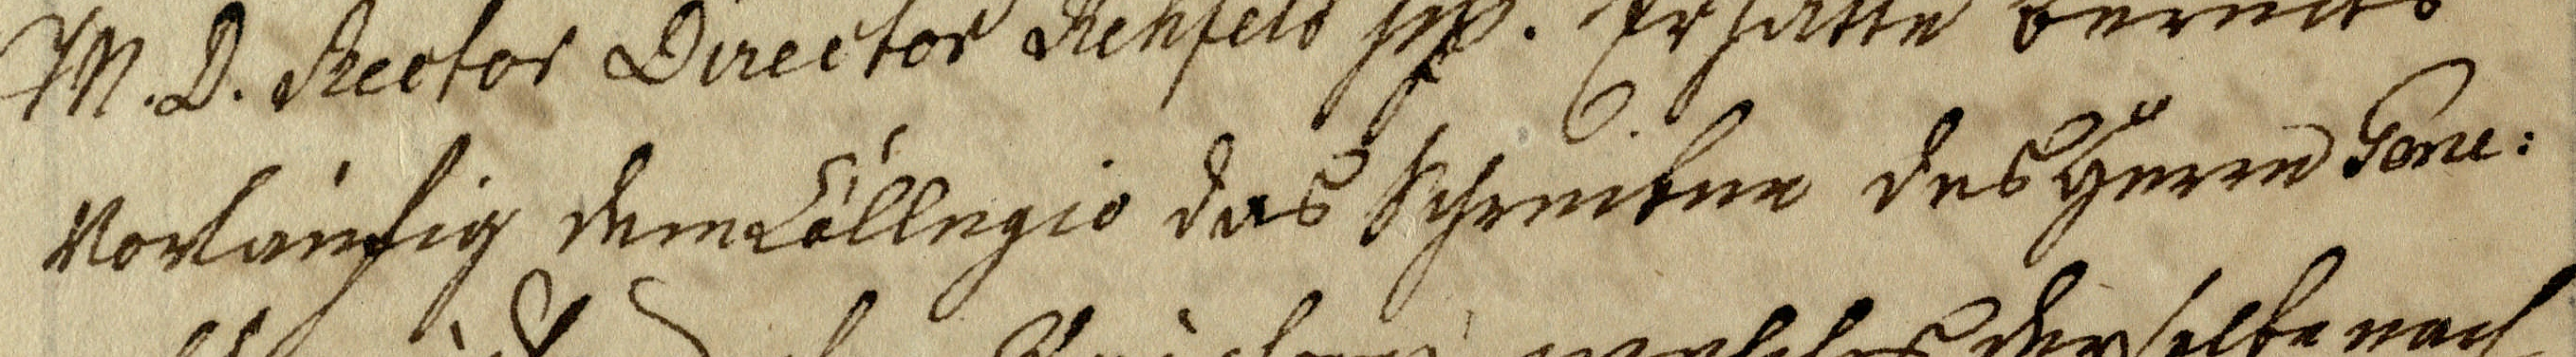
vorläufig dem Collegio das Schreiben des Herrn Gene¬
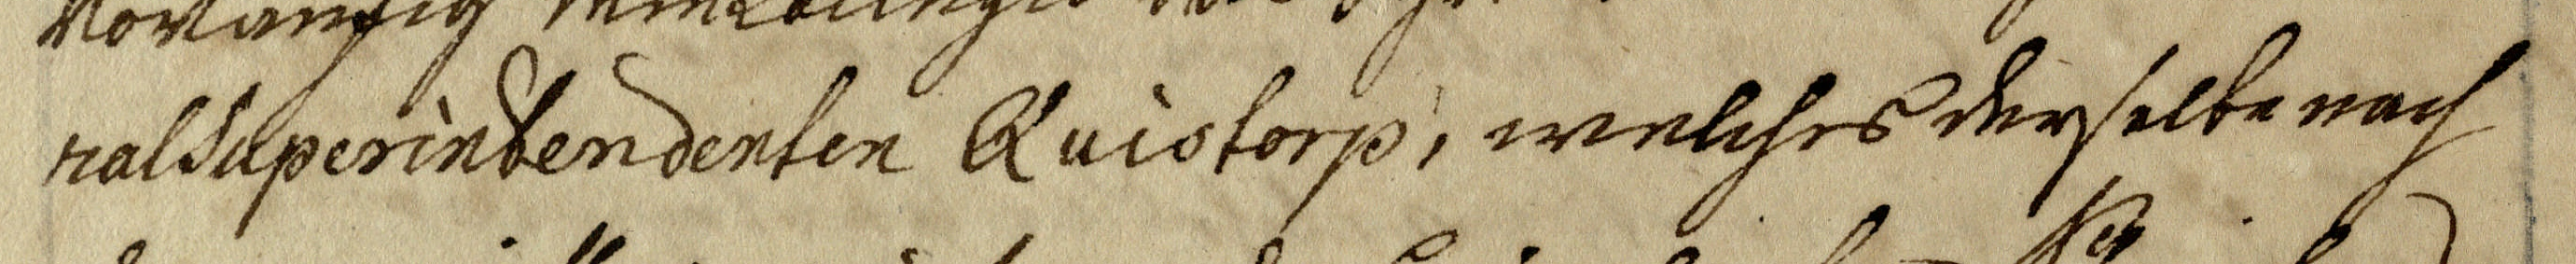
ralSuperintendenten Quistorp, welches derselbe nach
